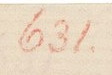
Florence
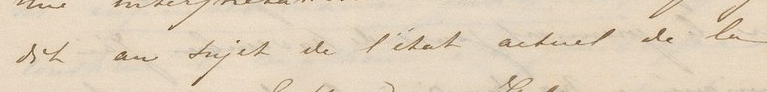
dit au sujet de l'état actuel de la
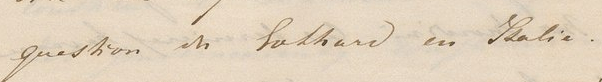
question du Gothard en Italie.
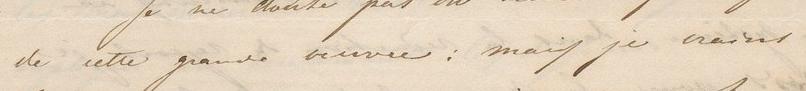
de cette grande oeuvre: mais je crains
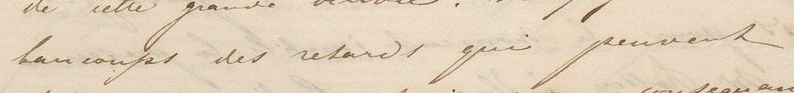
baucoups des retards qui peuvent
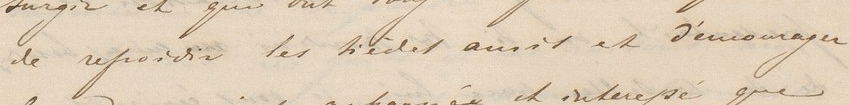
de refroidir les tièdes amis et d'encourager
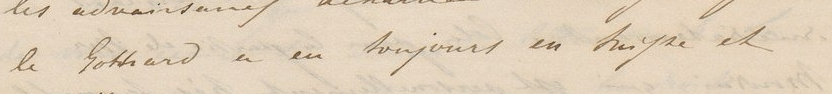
le Gothard a eu toujours en Suisse et
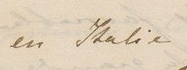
en Italie.
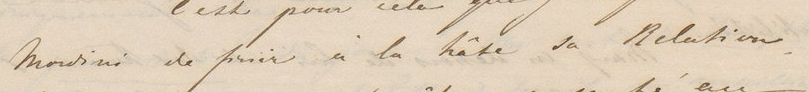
Mordini de finir à la hâte sa Relation
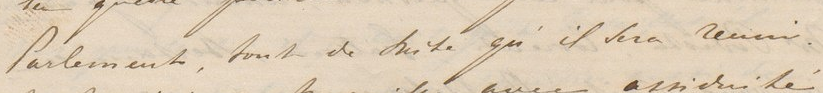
Parlement, tout de suite qu'il sera reuni.
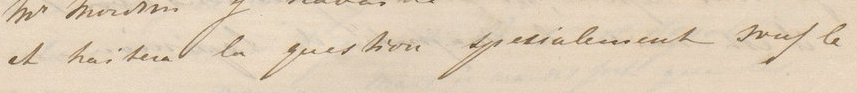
et traitera la question specialement sous le
